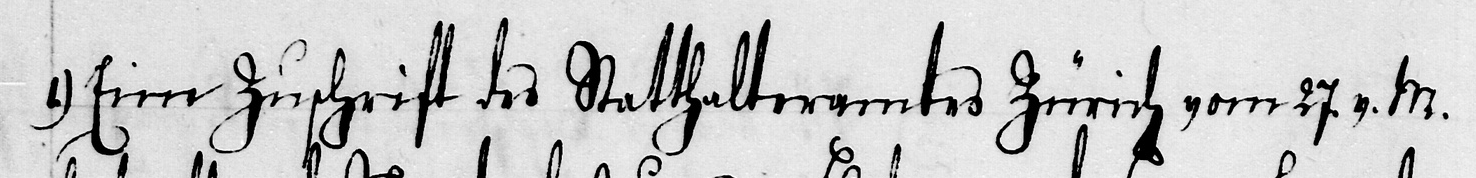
1.) Eine Zuschrift des Statthalteramtes Zürich vom 27. v. M.
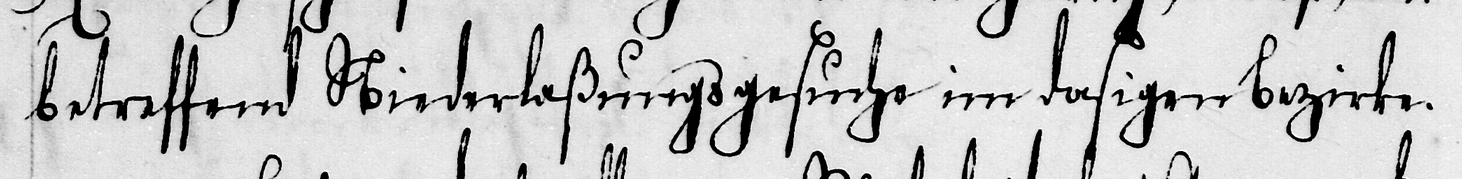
betreffend Niederlaßungsgesuche im dasigen Bezirke.
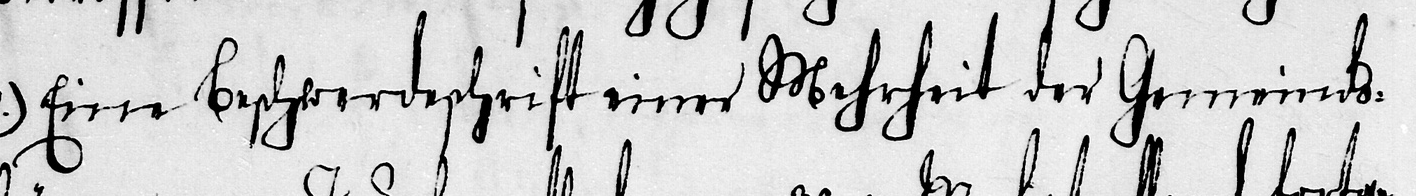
Eine Beschwerdeschrift einer Mehrheit der Gemeinds¬
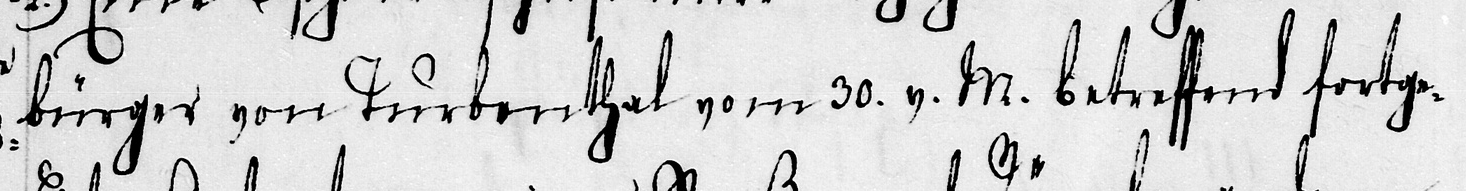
bürger von Turbenthal vom 30. v. M. betreffend fortge¬
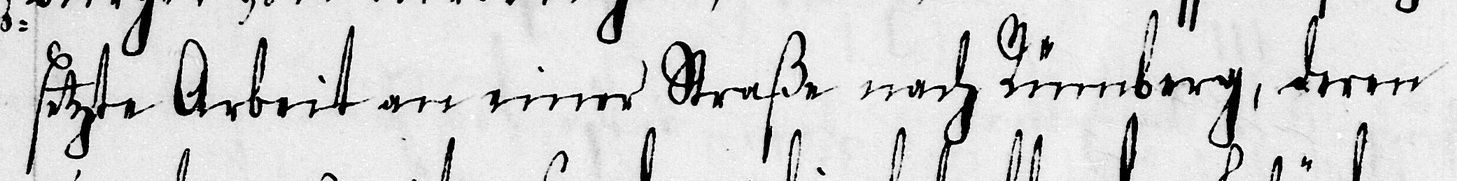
setzte Arbeit an einer Straße nach Rümberg, deren
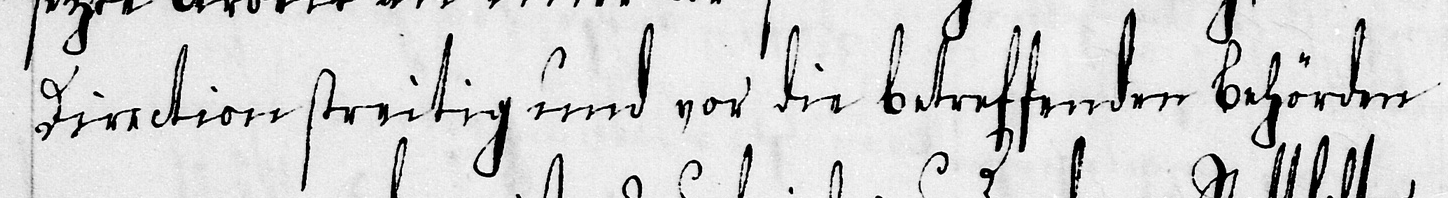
Direction streitig und vor die betreffenden Behörden
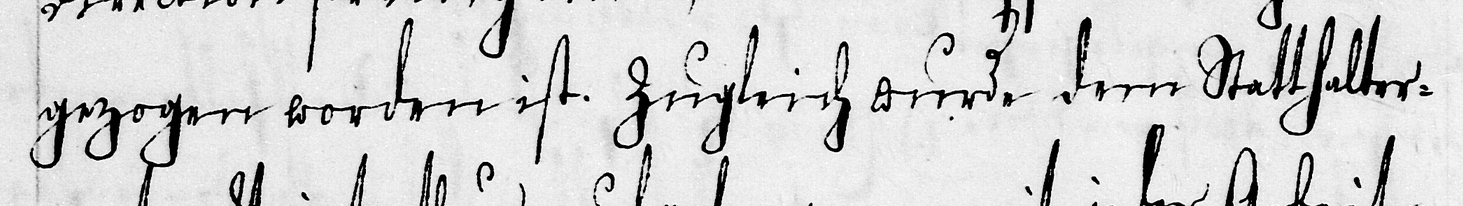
gezogen worden ist. Zugleich wurde dem Statthalter¬
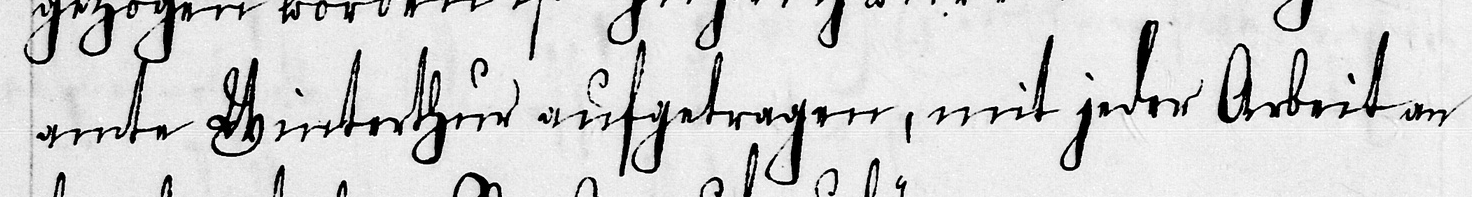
amte Winterthur aufgetragen, mit jeder Arbeit an
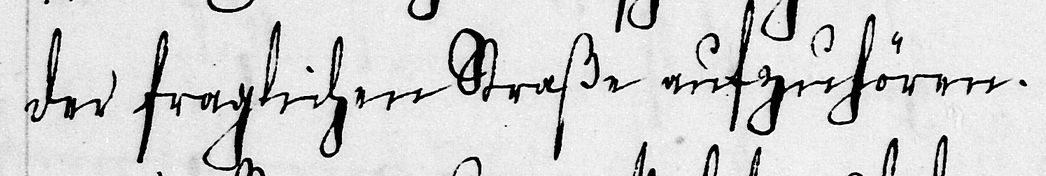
der fraglichen Straße aufzuhören.
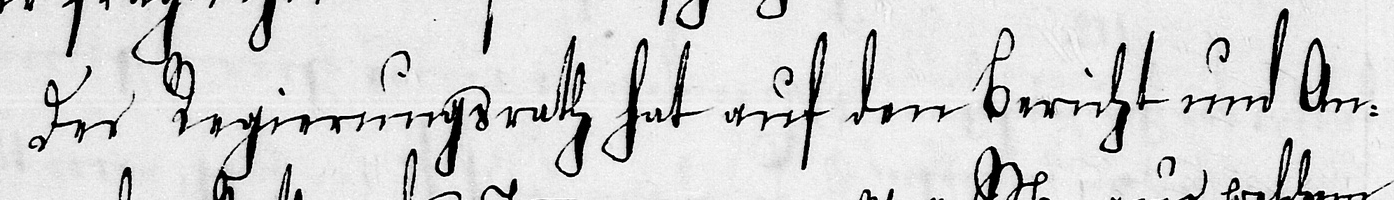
Der Regierungsrath hat auf den Bericht und An¬
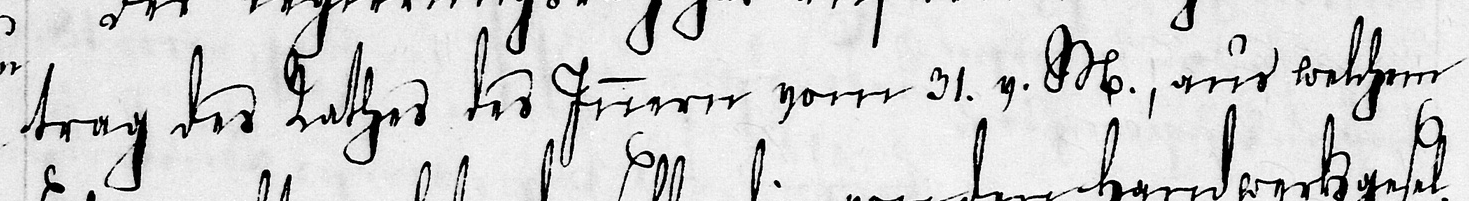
trag des Rathes des Innern vom 31. v. M., aus welchem
